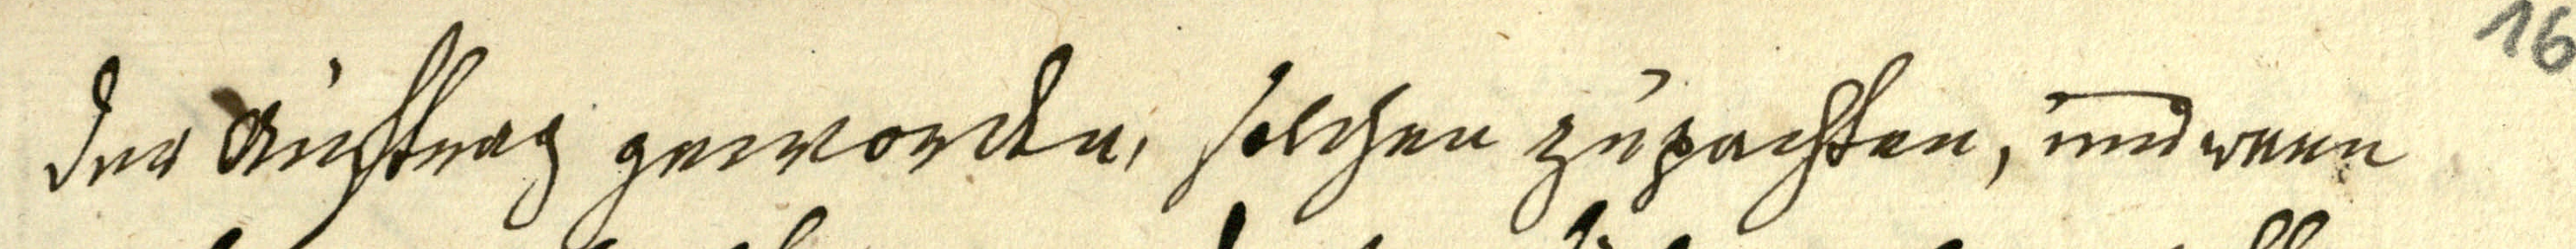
der Auftrag geworden, solchen zupachten, und wenn
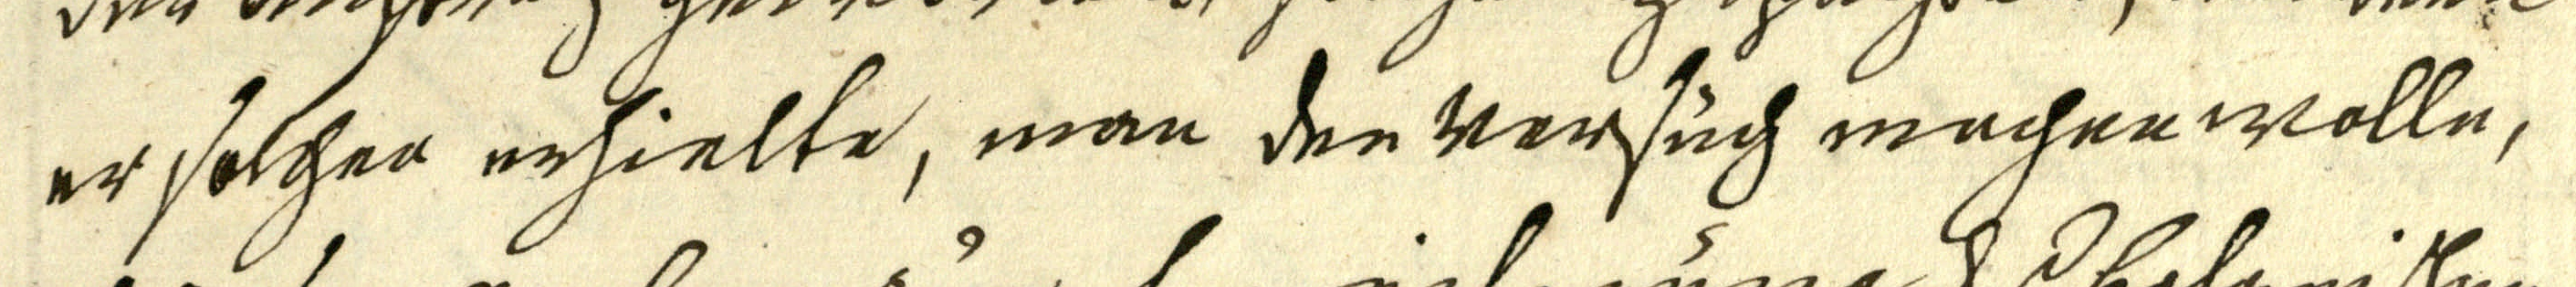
er solchen erhielte, man den Versuch machen wolle,
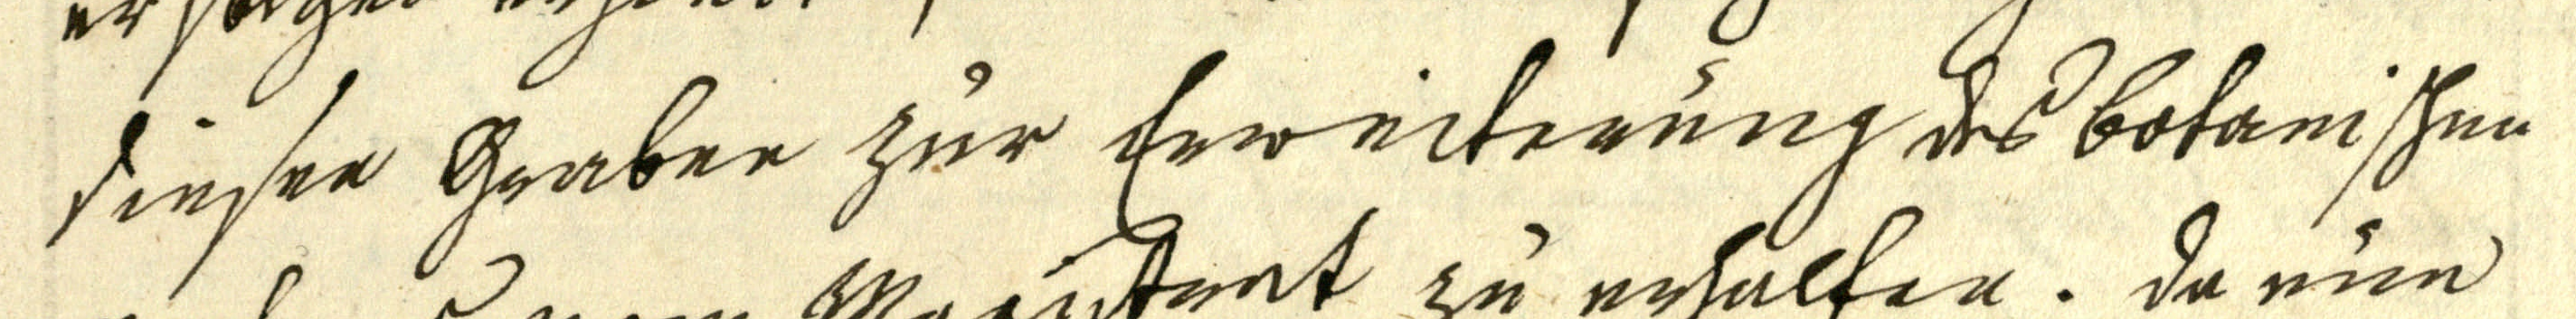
diesen Graben zur Erweiterung des botanischen
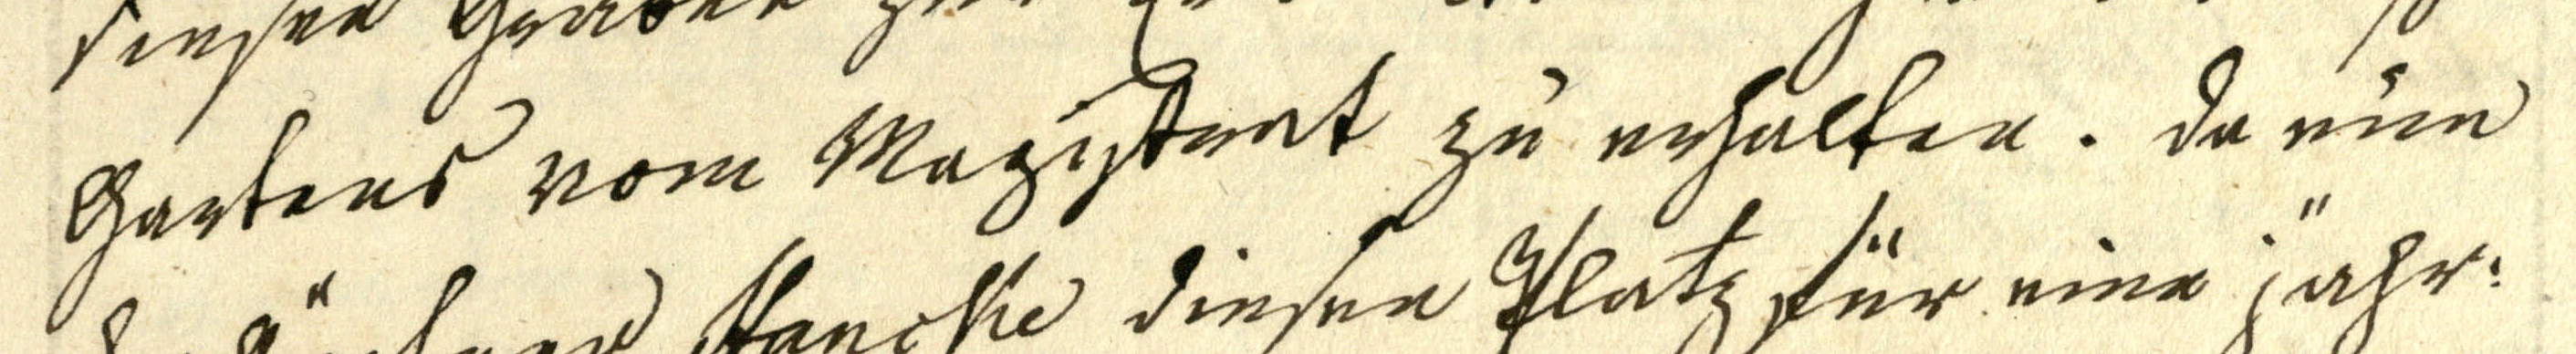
Gartens vom Magistrat zu erhalten. Da nun
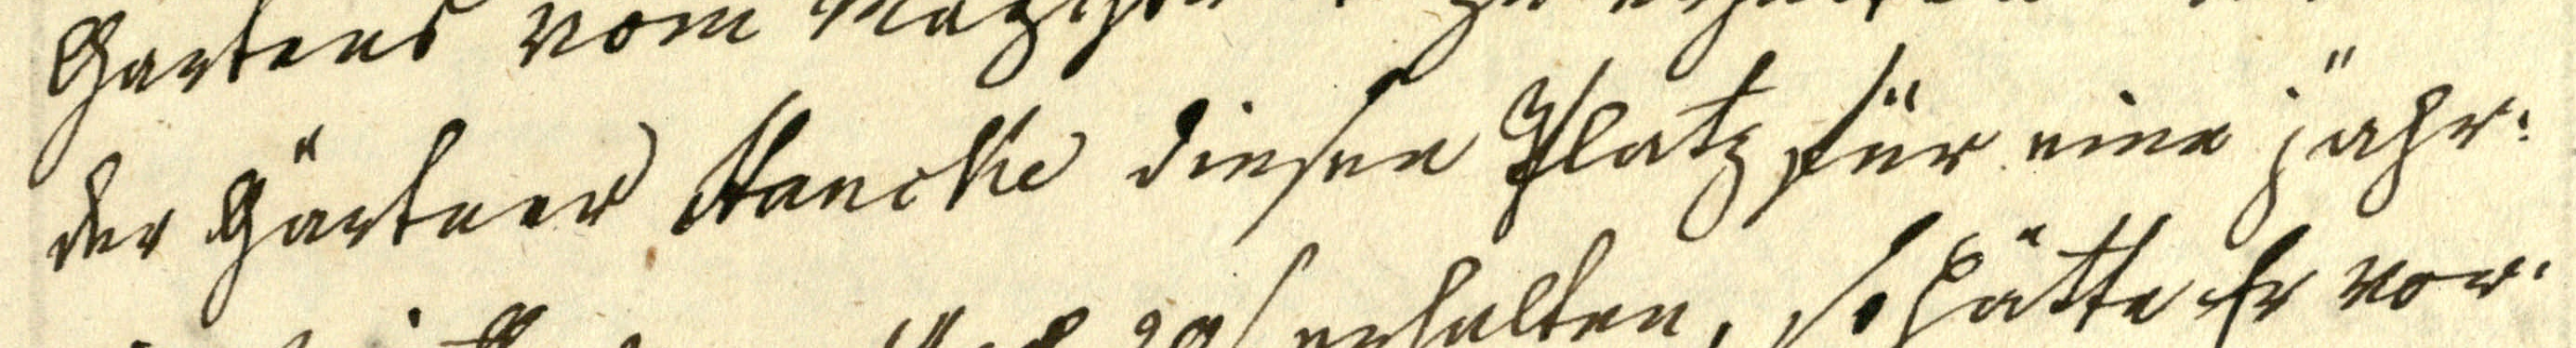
der Gärtner Hancke diesen Platz für eine jähr¬
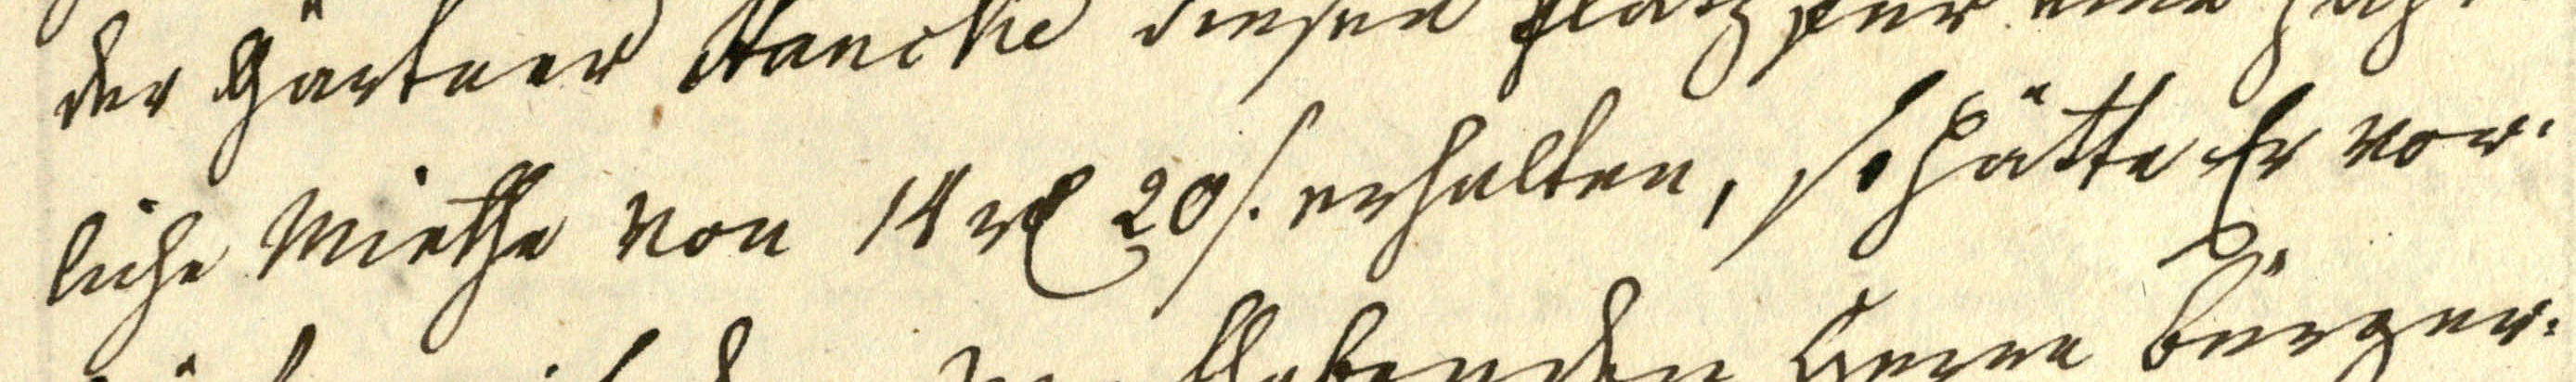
liche Miethe von 14 rl. 20 s. erhalten, so hätte Er vor¬
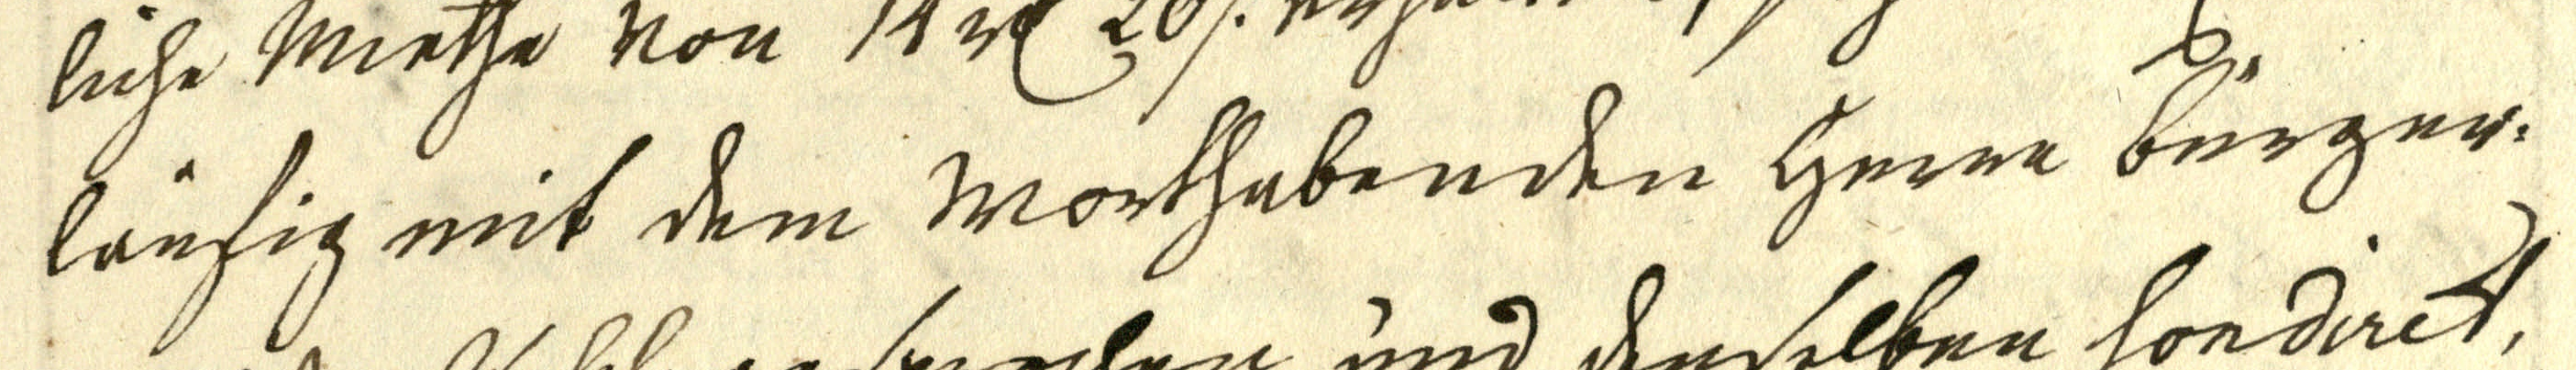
läufig mit dem worthabenden Herrn Bürger¬
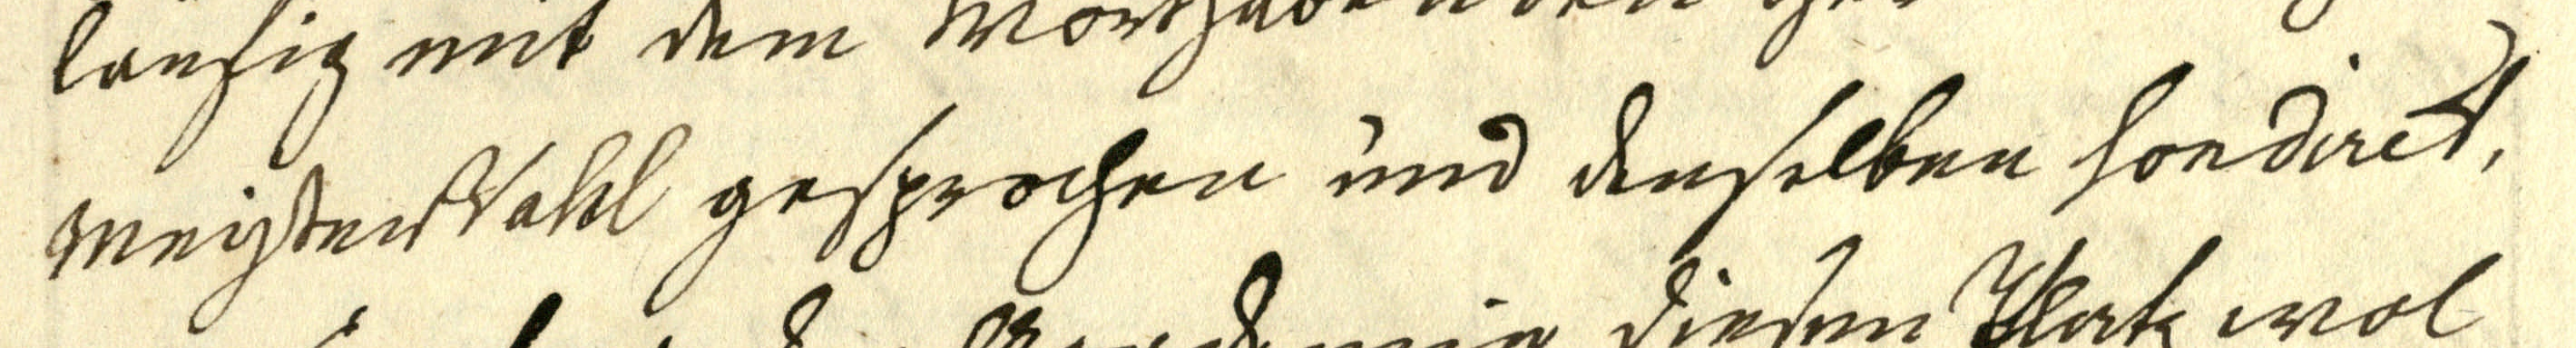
Meister Vahl gesprochen und denselben sondiret,
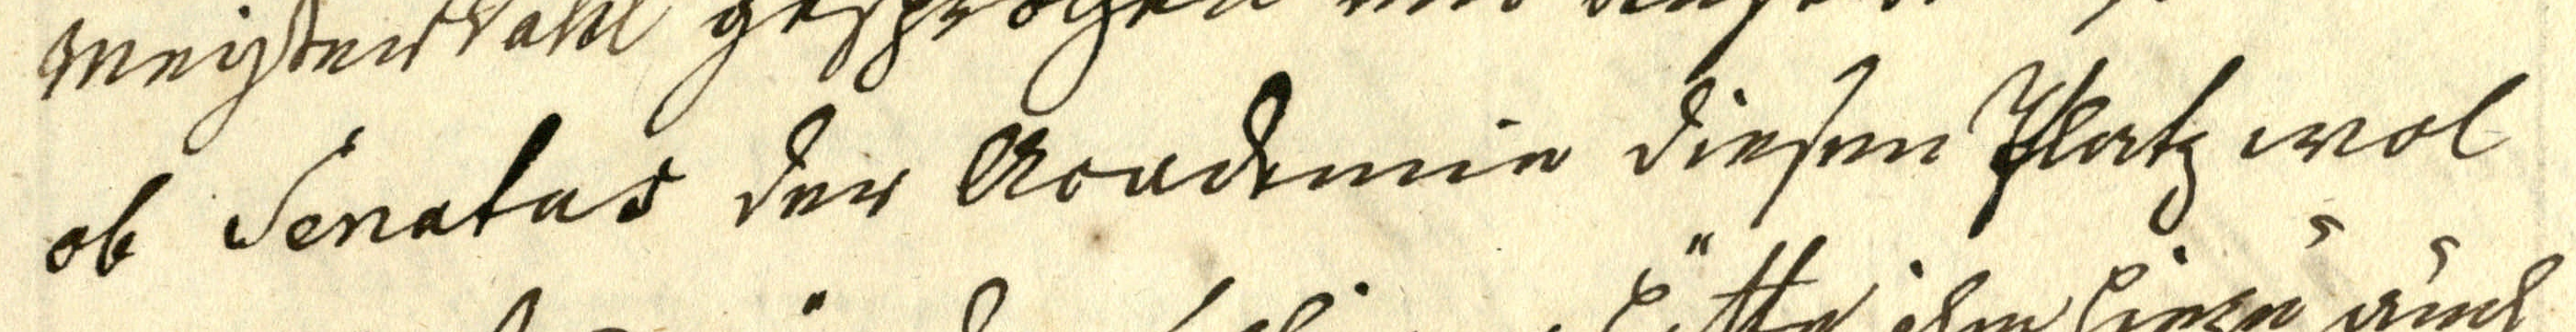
ob Senatus der Academie diesen Platz wol
